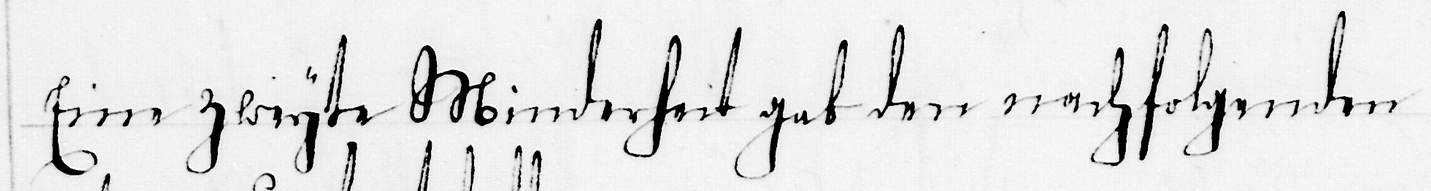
Eine zweyte Minderheit gab den nachfolgenden
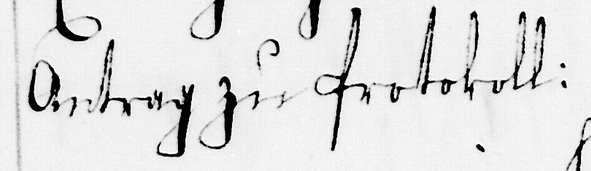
Antrag zu Protokoll:
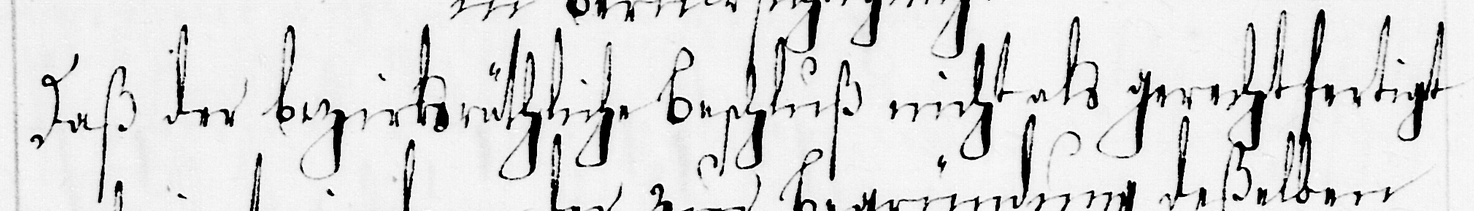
Daß der bezirksräthliche Beschluß nicht als
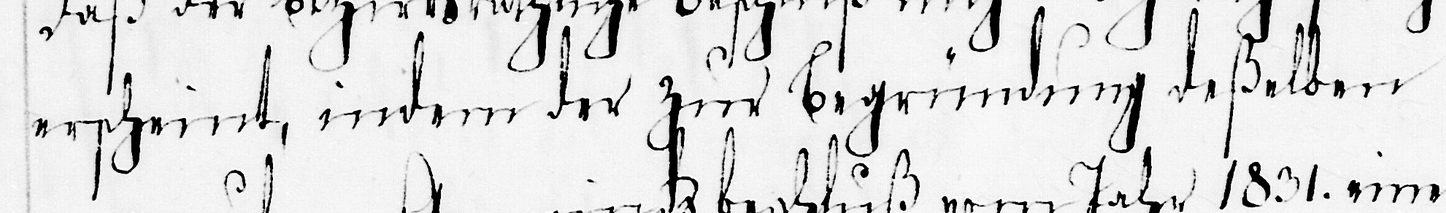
erscheint, indem der zur Begründung deßelben
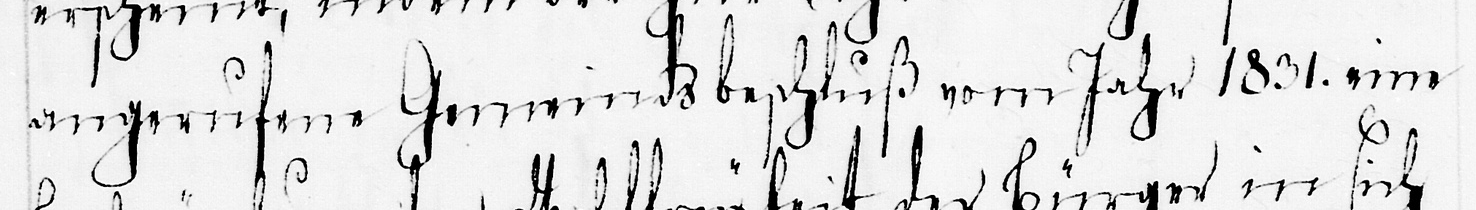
angerufene Gemeindsbeschluß vom Jahr 1831. eine
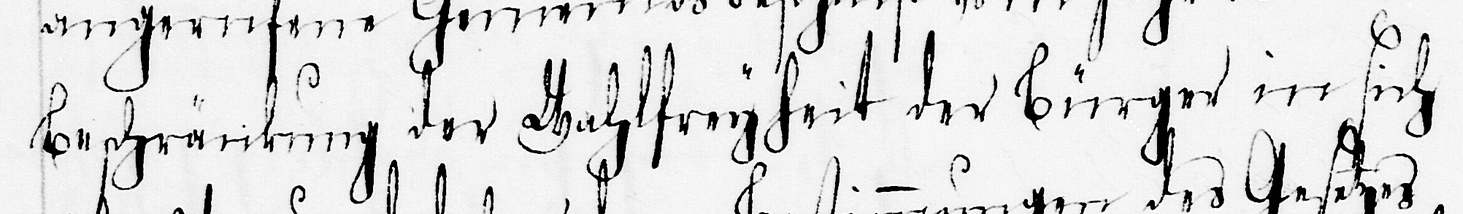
Beschränkung der Wahlfreyheit der Bürger in sich
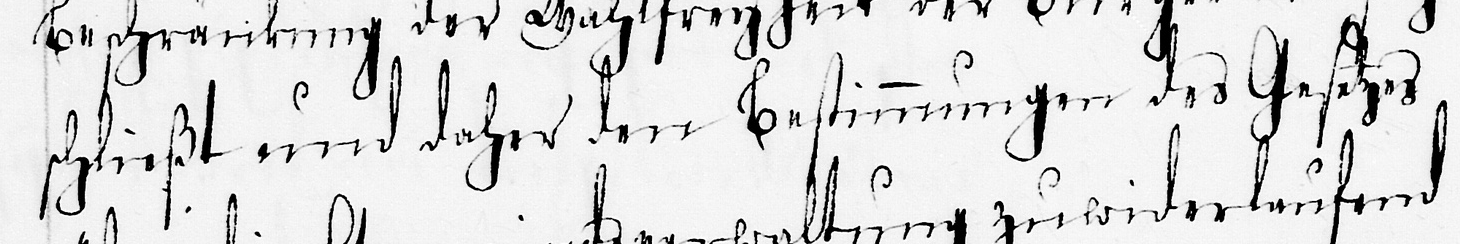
schließt und daher den Bestimmungen des Gesetzes
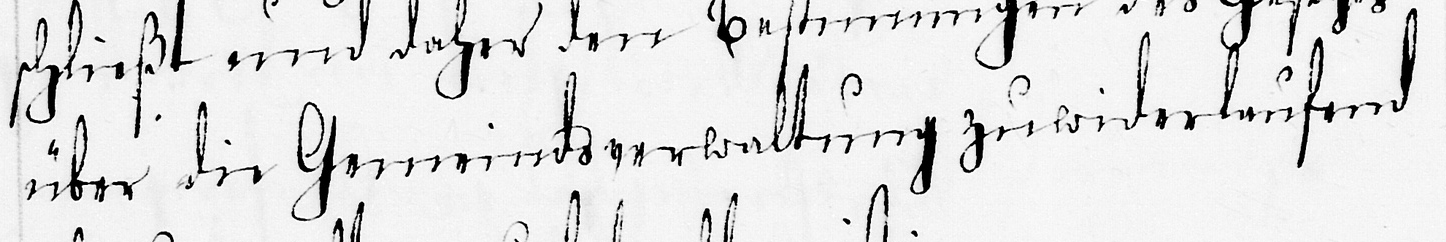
über die Gemeindsverwaltung zuwiderlaufend
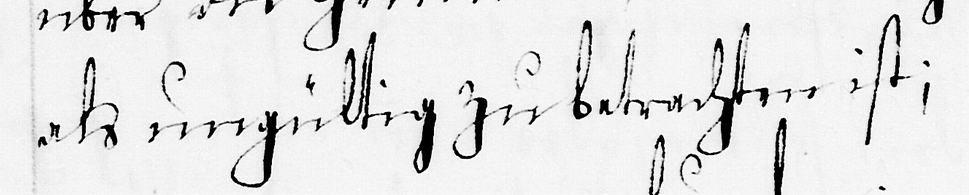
als ungültig zu betrachten ist;
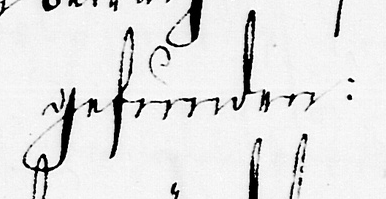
gefunden:
